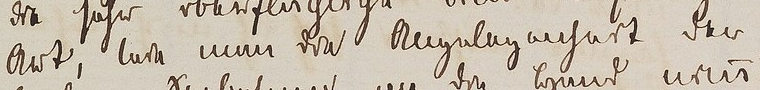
Art, wie man die Angelegenheit der
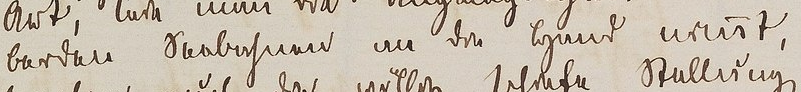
beiden Seebahnen an die Hand nimmt,
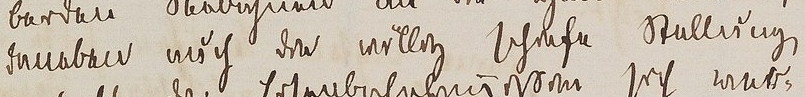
daneben auch die völlig schiefe Stellung,
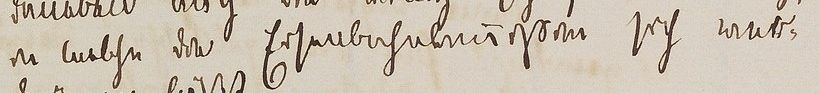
in welche die Eisenbahnkommission sich ver-
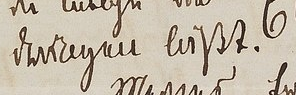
drängen läßt.
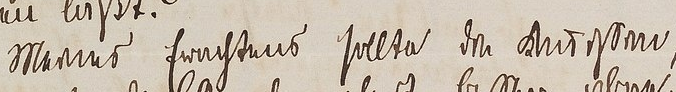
Meines Erachtens sollte die Kommission
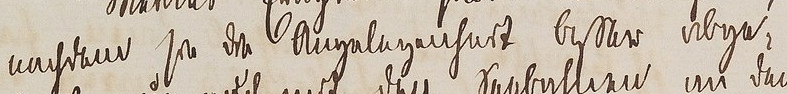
nachdem sie die Angelegenheit besser abge-
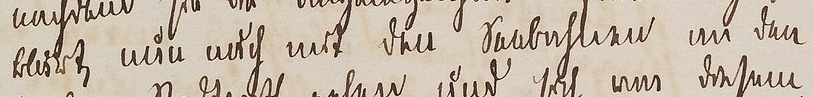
klärt, nun auch mit den Seebahnen an den
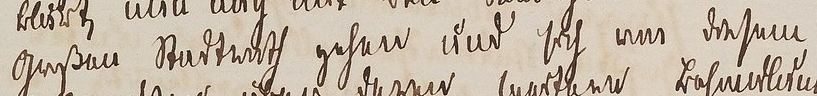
Großen Stadtrath gehen und sich von diesem
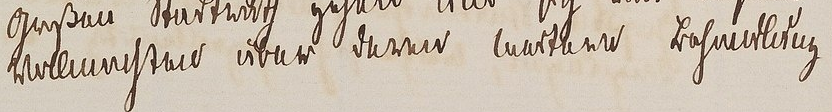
Vollmachten über deren weiteren Behandlung
